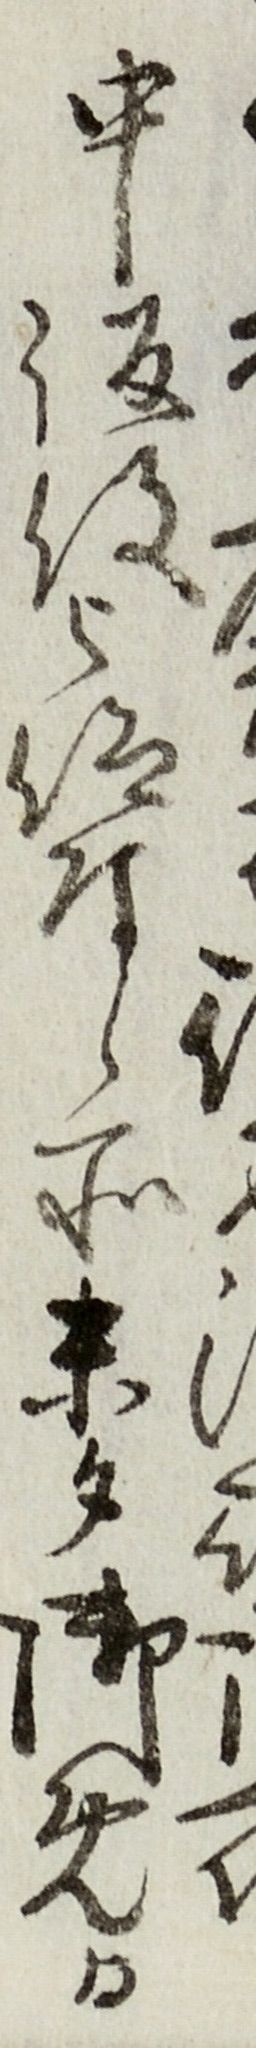中仮役被仰付候所未タ御免被
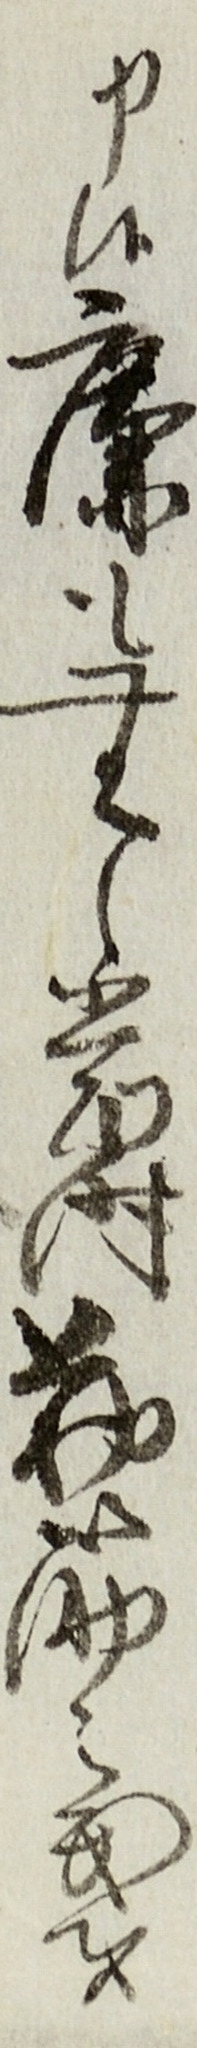申候廉も無之当時勤筋之義
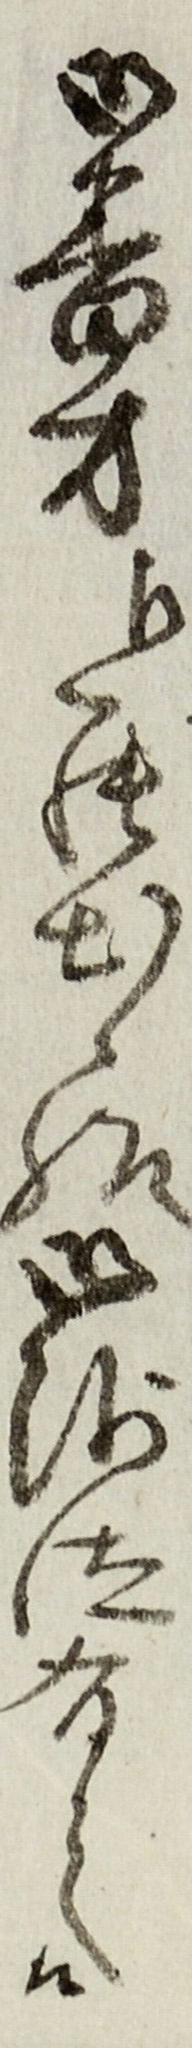御番方江罷出候様御沙汰有之候
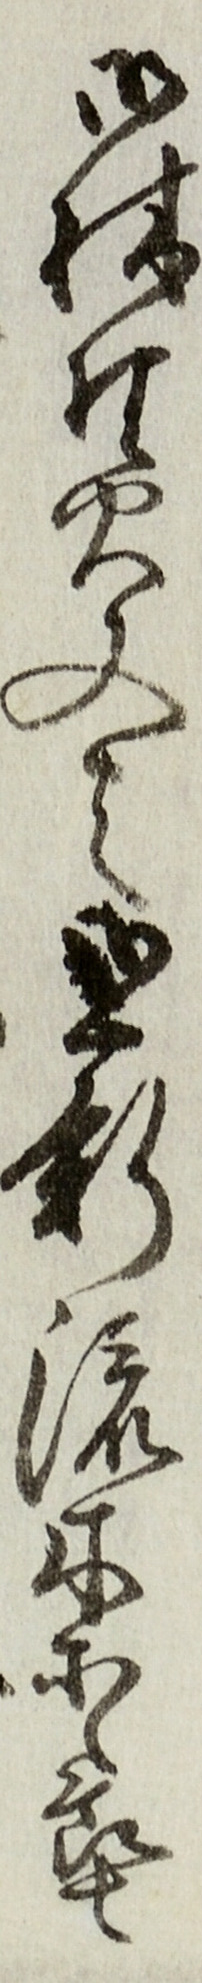御林野火又者御薪流木等之節者
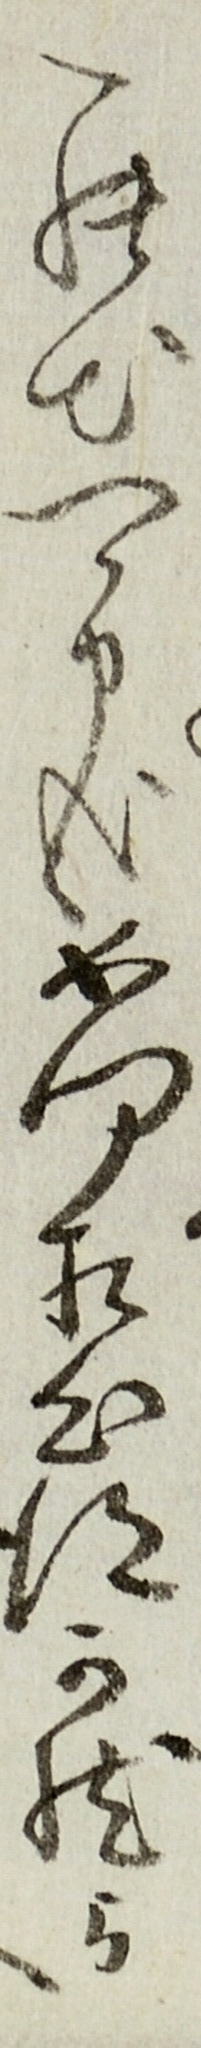罷出可申哉如何相心得可然与
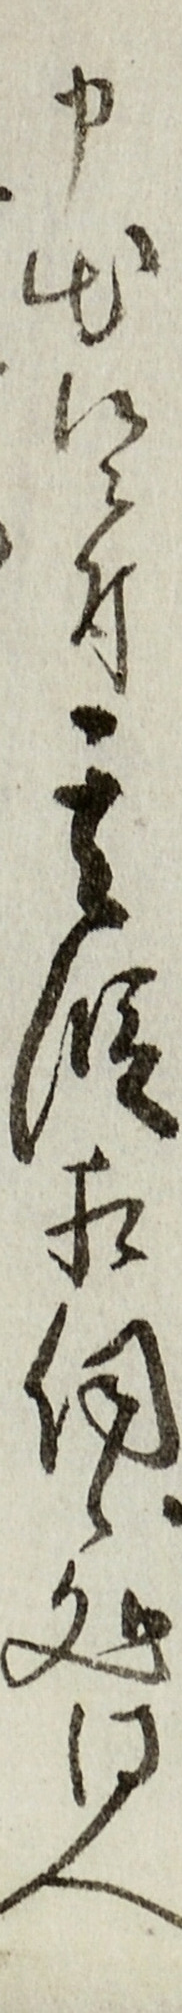申出候ニ付其段相伺候処同人
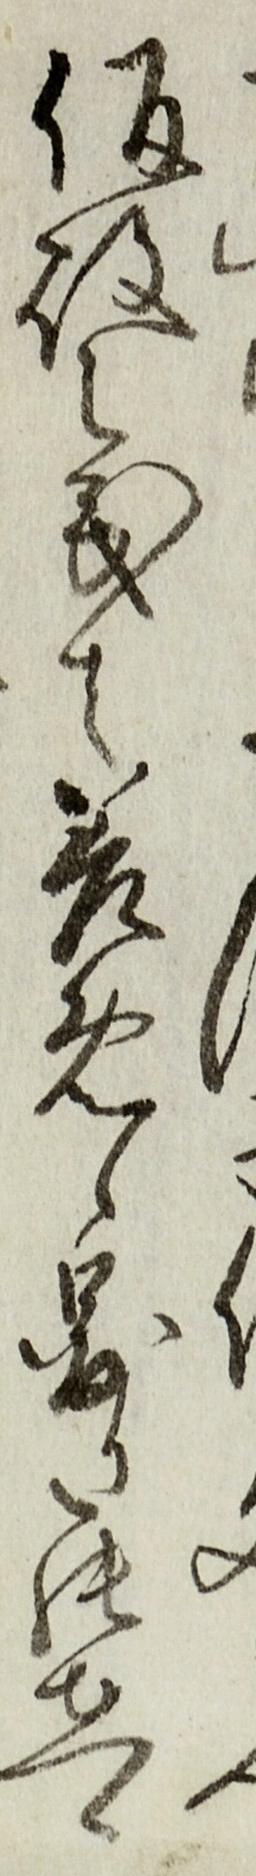仮役之義者差免候図り罷在候
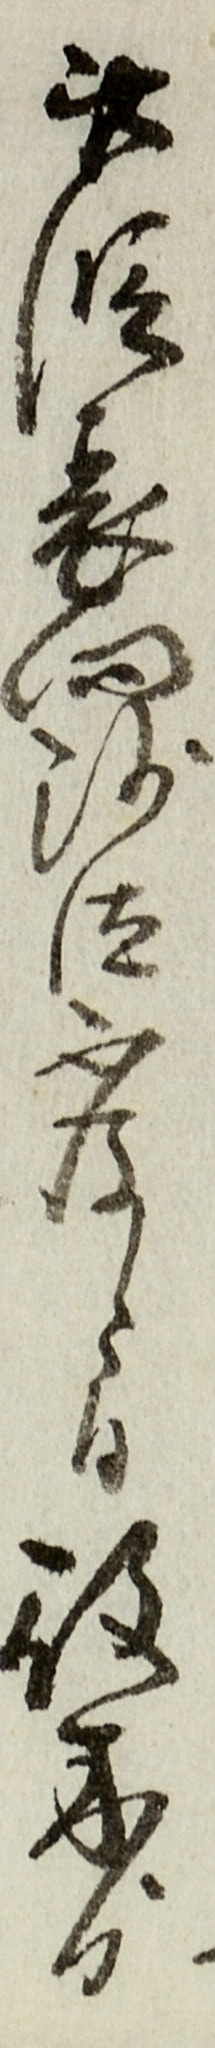此段表向沙汰不及候ニ付役方ゟ
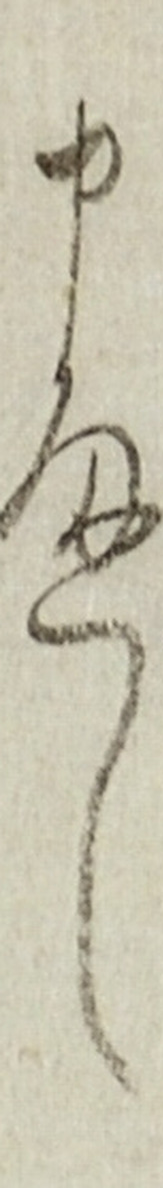申通候
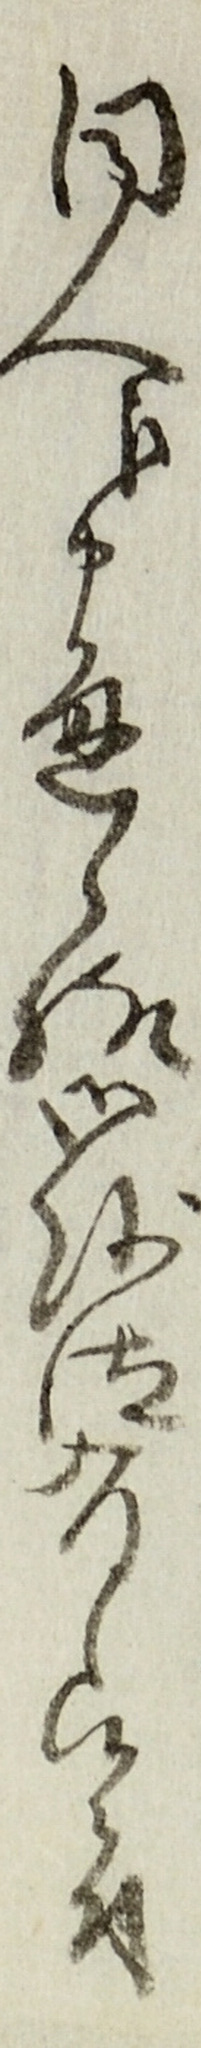同人江申通候様御沙汰有之候ニ付
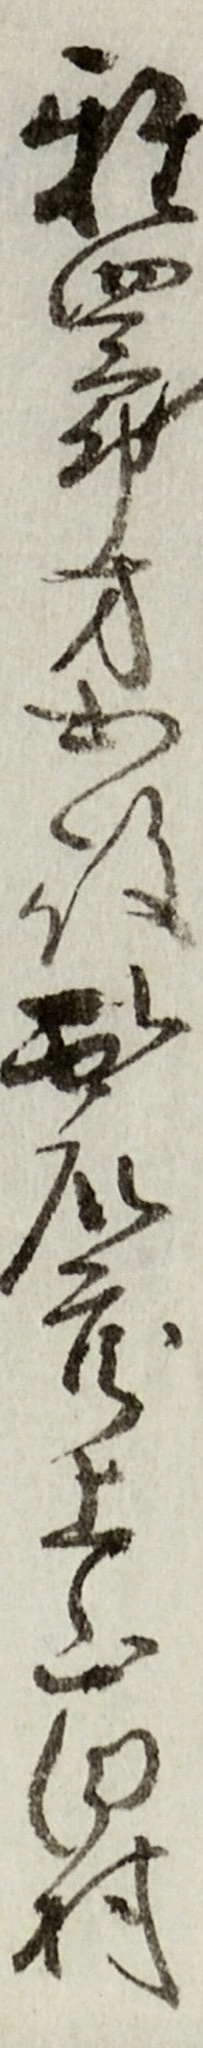雅四郎方出役麗蔵上山田村
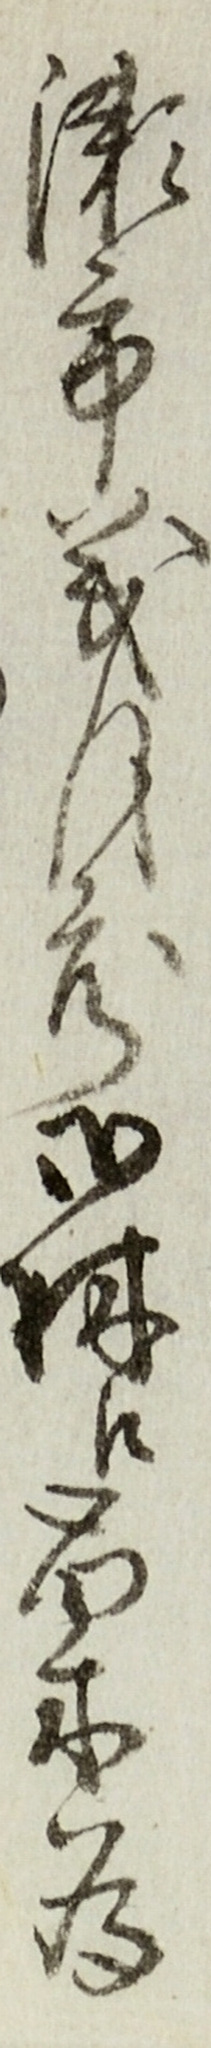瀬市義月蔵御林江苗木為
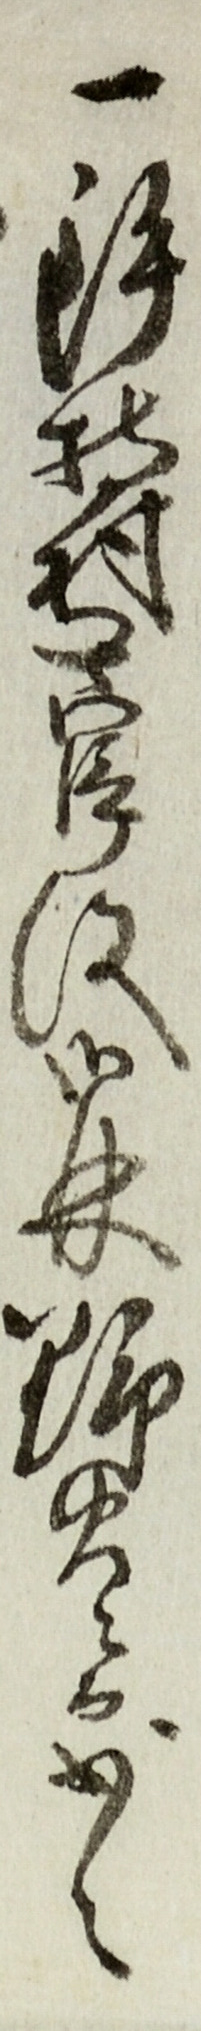一鉾持村菅沢御林野火ニ而少々
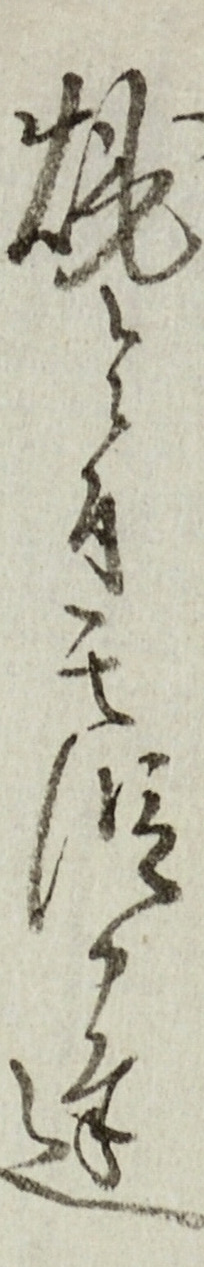焼候ニ付其段申達
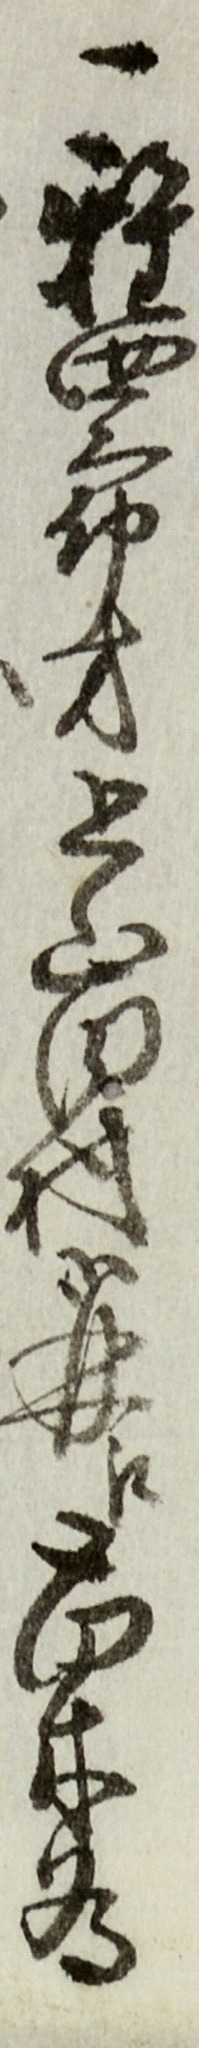一雅四郎方上山田村御林江苗木為
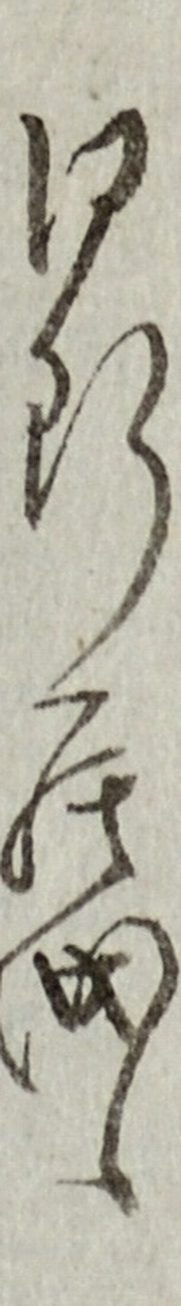同断罷越候
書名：御山方御薪方諸事御用留
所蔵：伊那市立高遠町図書館・合同会社AMANE
